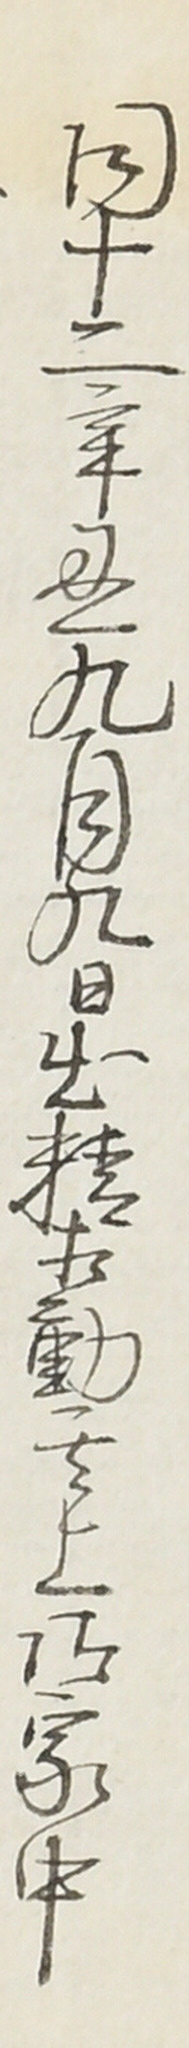一同十二辛丑九月九日出精相勤其上御家中
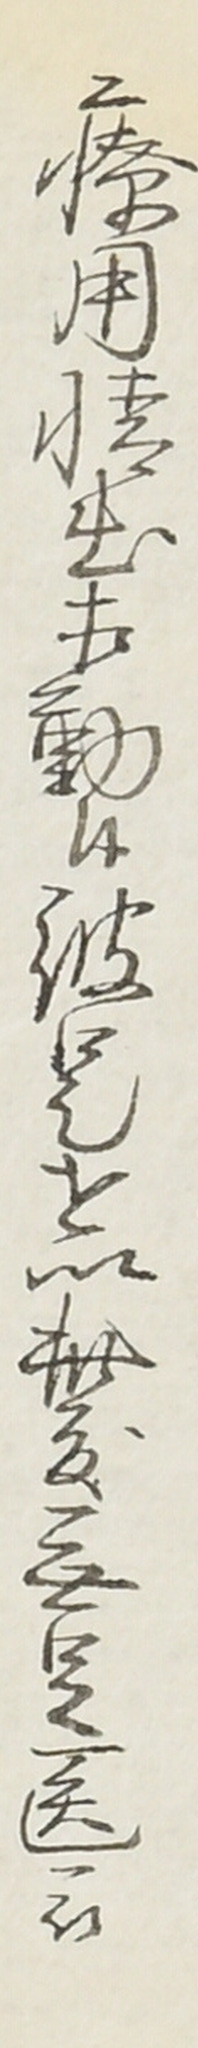療用情出相勤候彼是を以此度無足医被
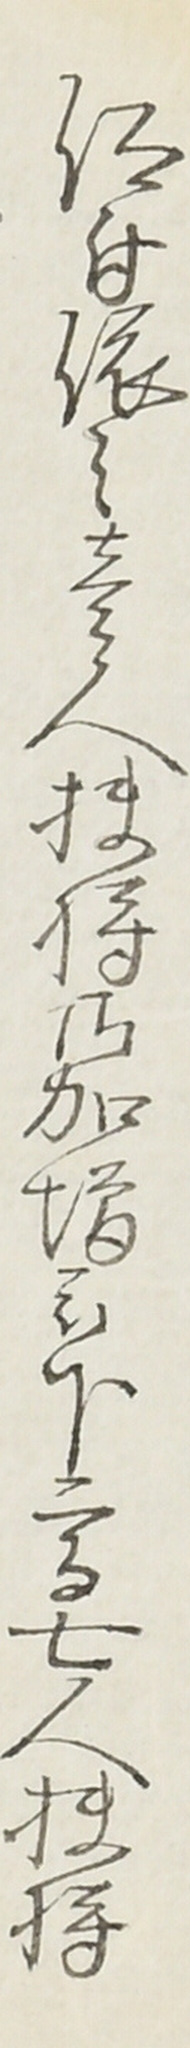仰付依之壱人扶持御加増被下高七人扶持
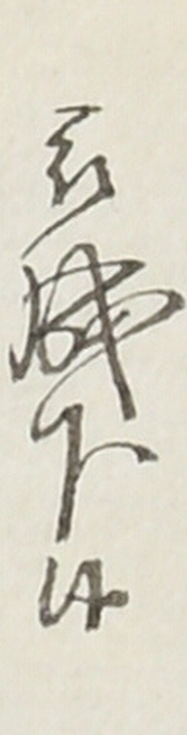被成下候
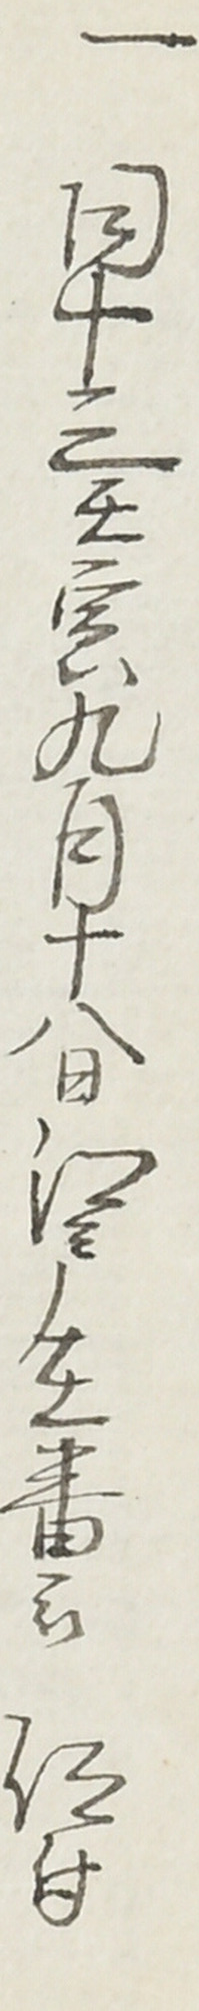一同十三壬寅九月十八日江戸在番被仰付
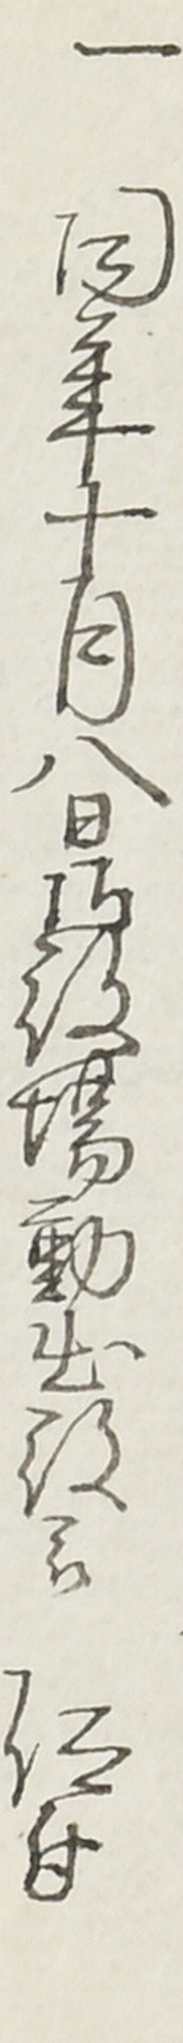一同年十月八日御役場勤出約被仰付
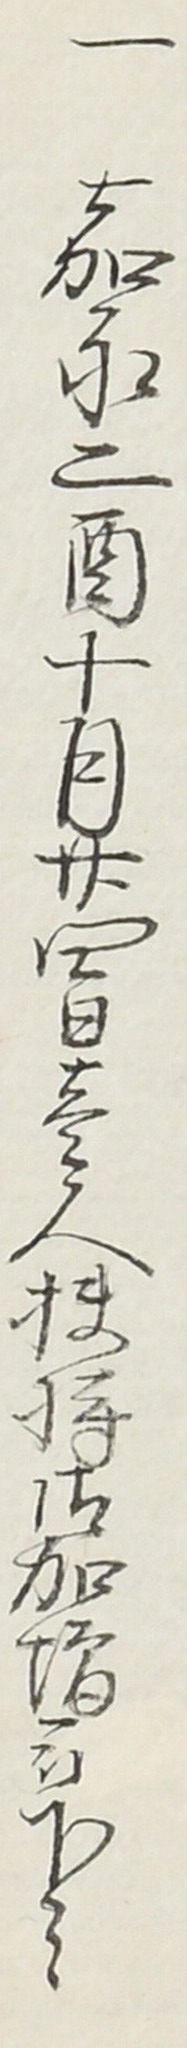一嘉永二酉十月廿四日壱人扶持御加増被下之
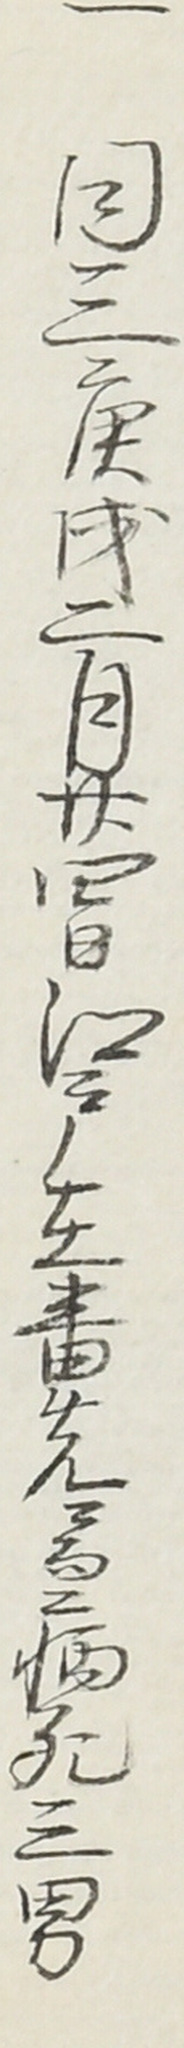一同三庚戌二月廿四日江戸在番先ニ而病死三男

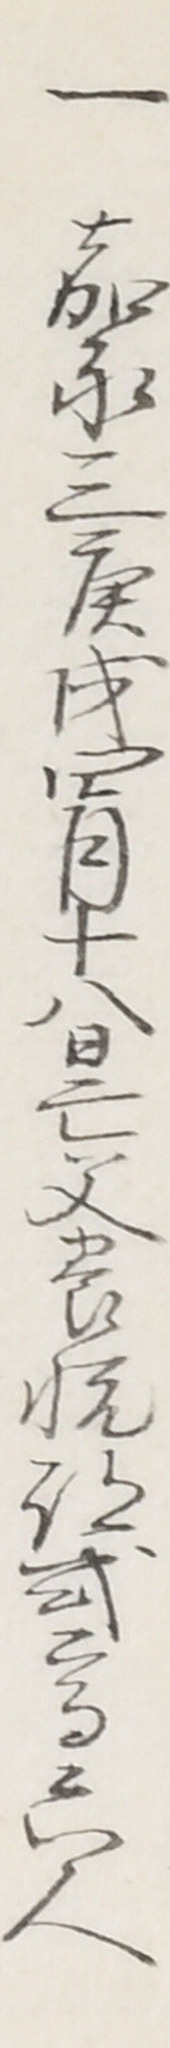一嘉永三庚戌四月十八日亡父養悦跡式高六人
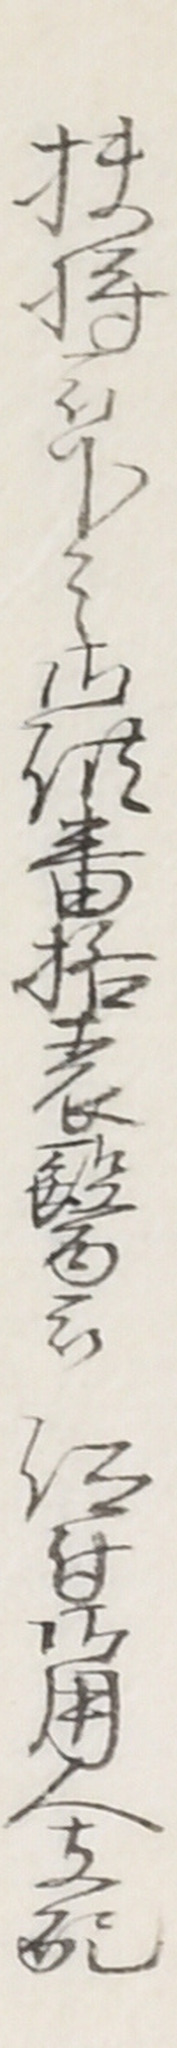扶持被下之御供番格表医被仰付御用人支配
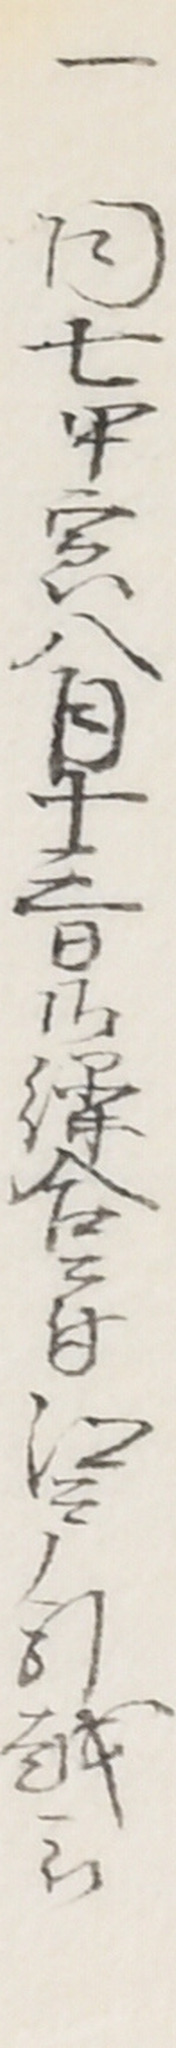一同七甲寅八月十三日御繰合ニ付江戸引越被
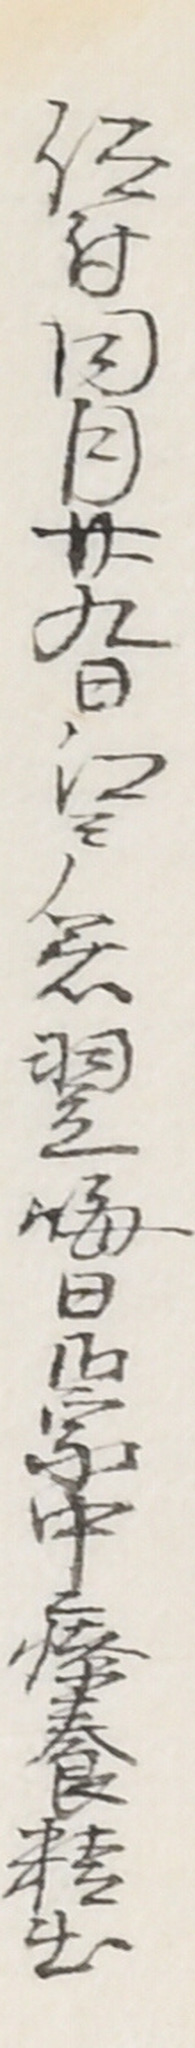仰付同月廿九日江戸着翌晦日御家中療養精出
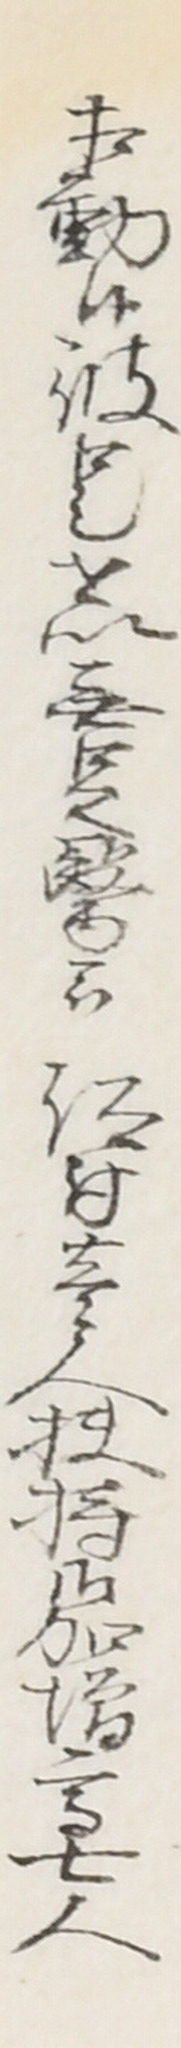相勤候彼是を以無足医被仰付壱人扶持御加増高七人
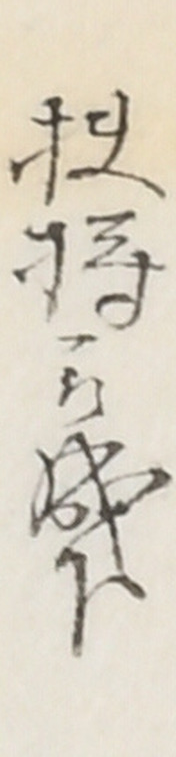扶持被成下
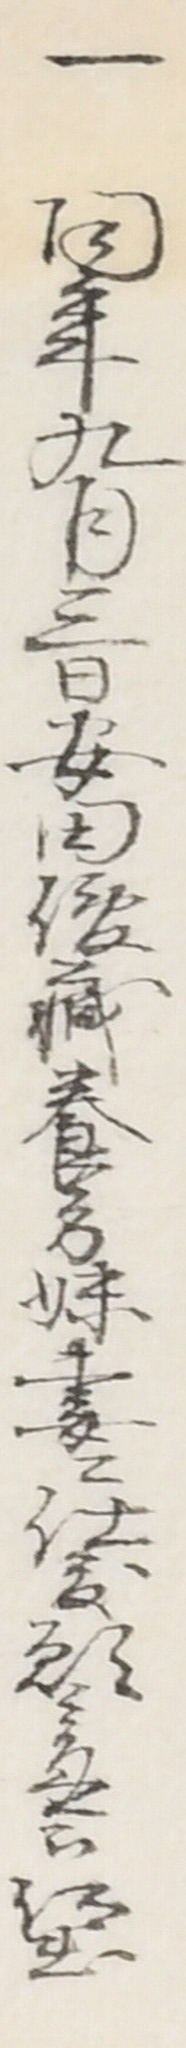一同年九月三日安田俊蔵養方妹妻ニ仕度願之通被仰出
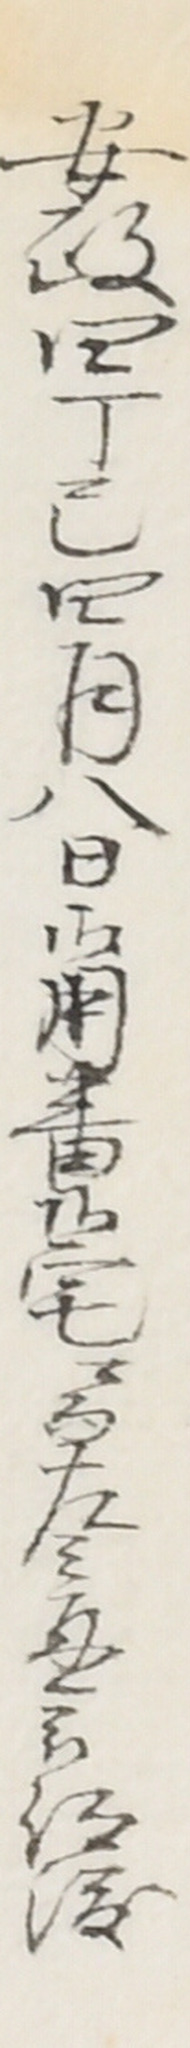一安政四丁巳四月八日御用番御宅ニ而左之通被仰渡
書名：給人諸士勤仕録（七）
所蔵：伊那市立高遠町図書館・合同会社AMANE
